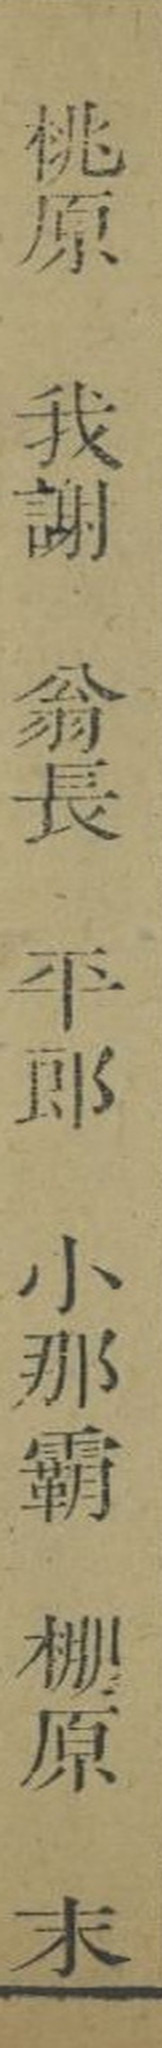桃原我謝翁長平郎小那覇棚原末
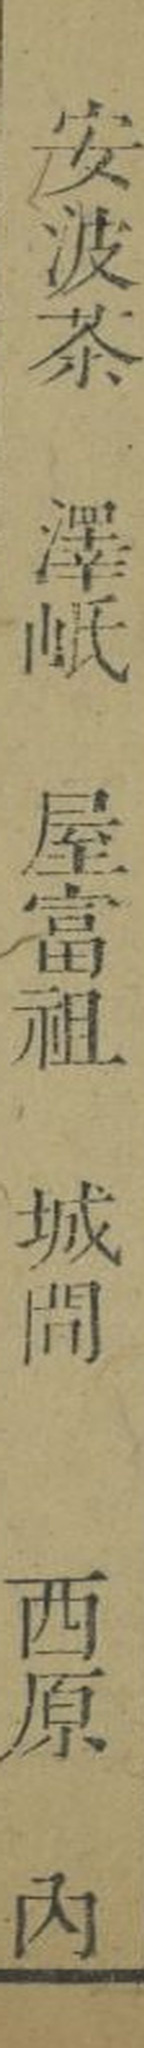安波茶沢㞴屋富祖城間西原内
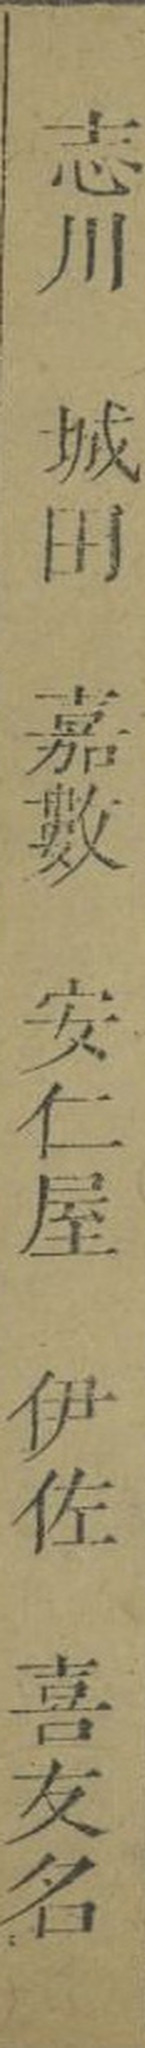志川城田嘉数安仁屋伊佐喜友名
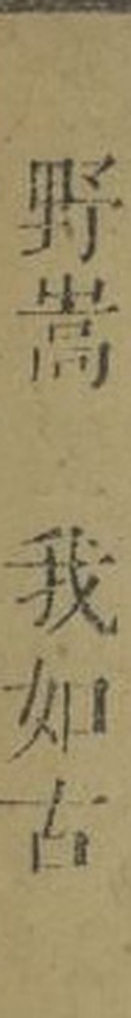野嵩我如古

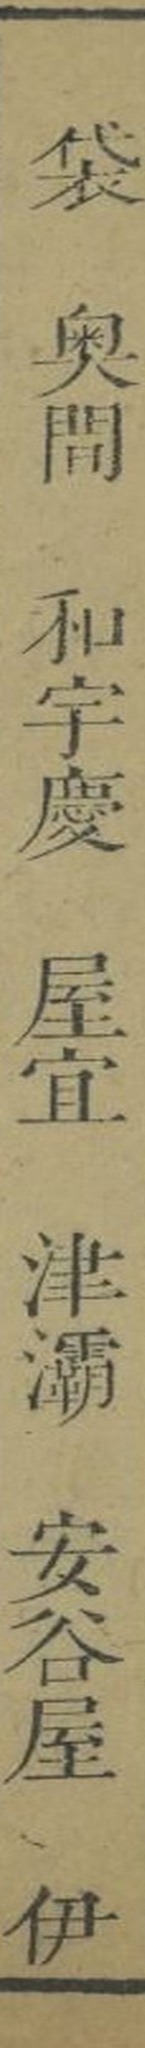袋奥間和宇慶屋宜津灞安谷屋伊
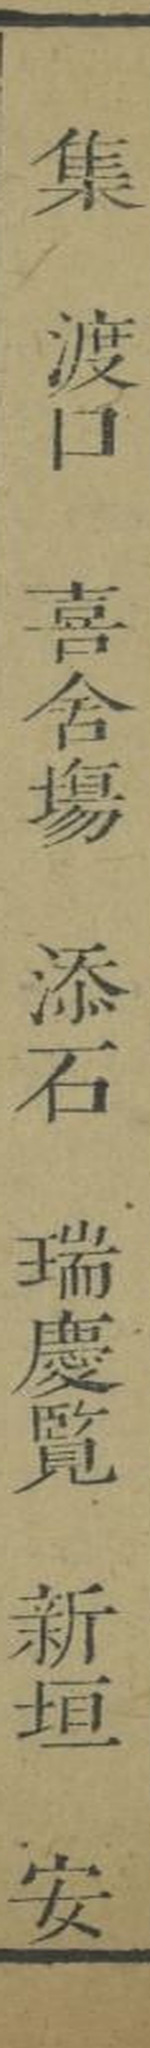集渡口喜舎場添石瑞慶覧新垣安
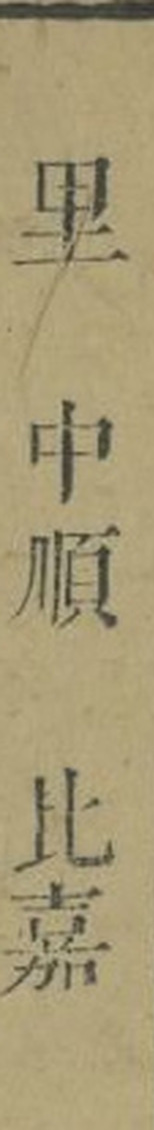里中順比嘉
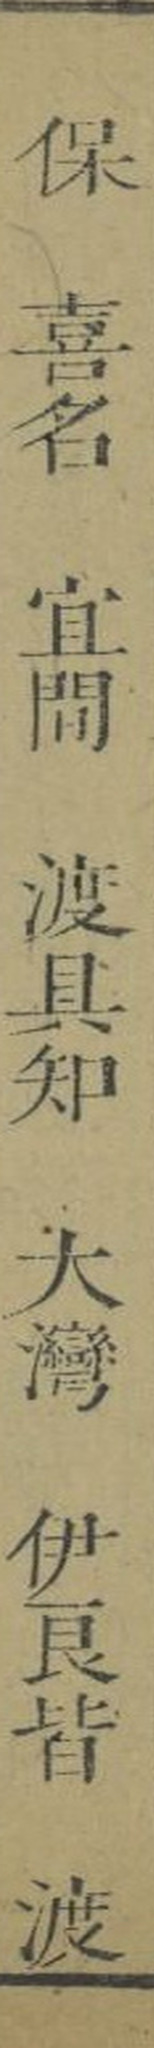保喜名宜間渡具知大湾伊良皆渡
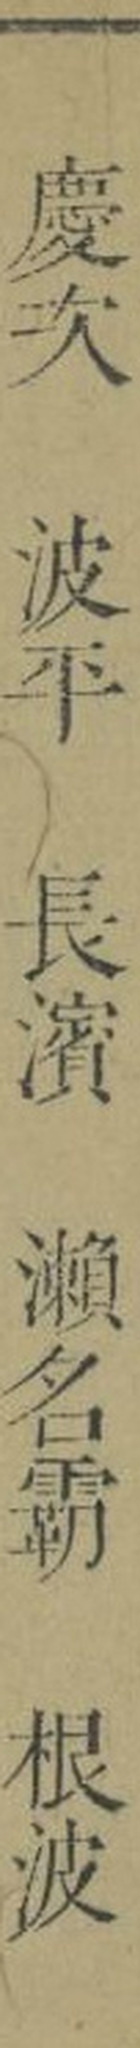慶次波平長浜瀬名覇根波
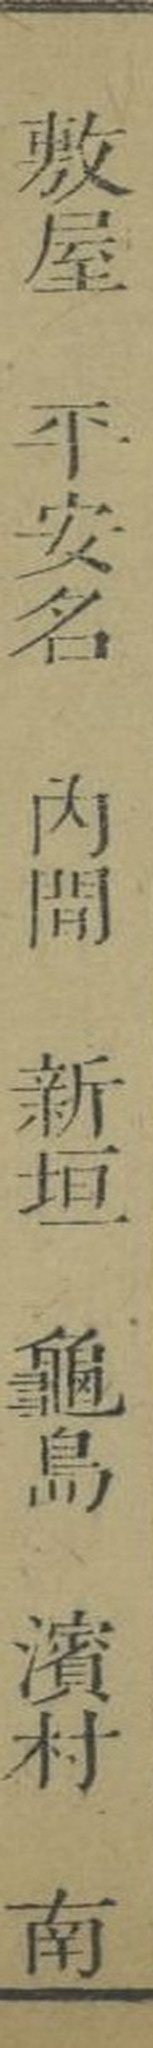敷屋平安名内間新垣亀島浜村南
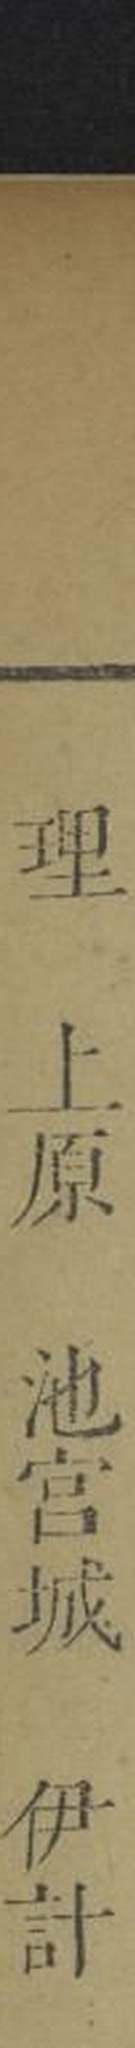理上原池宮城伊計
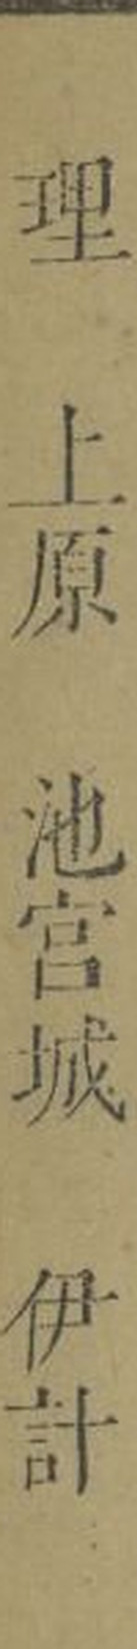理上原池宮城伊計

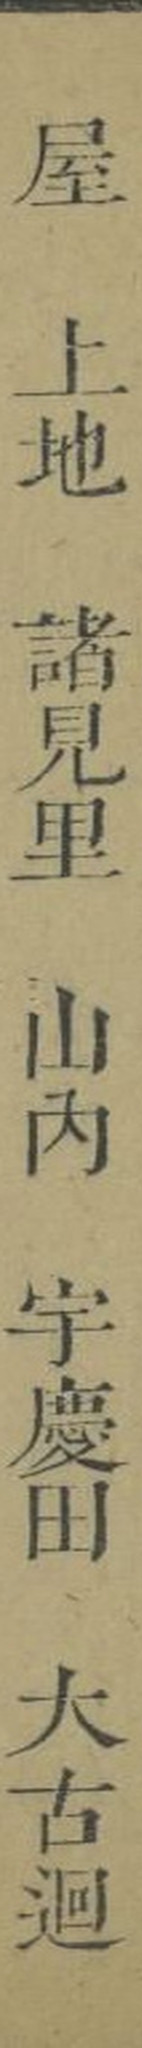屋上地諸見里山内宇慶田大古迴
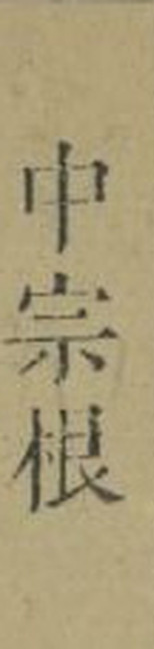中宗根
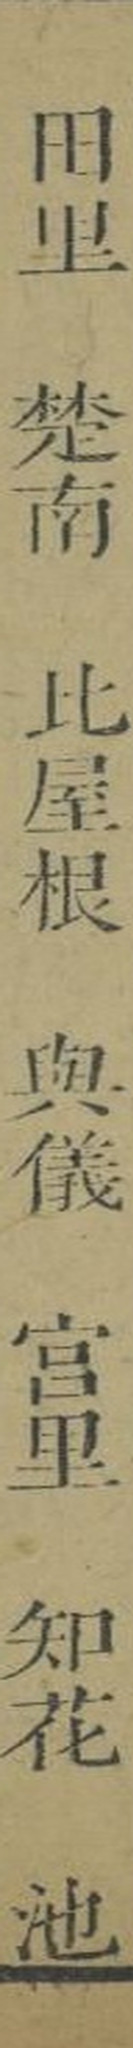田里楚南比屋根与儀宮里知花池
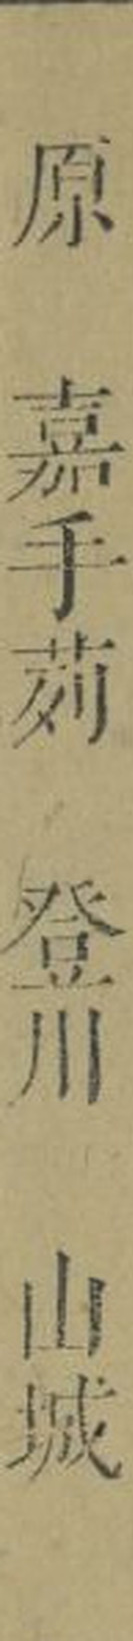原嘉手茢登川山城
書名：中山伝信録 巻四
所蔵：University of the Ryukyus Library
